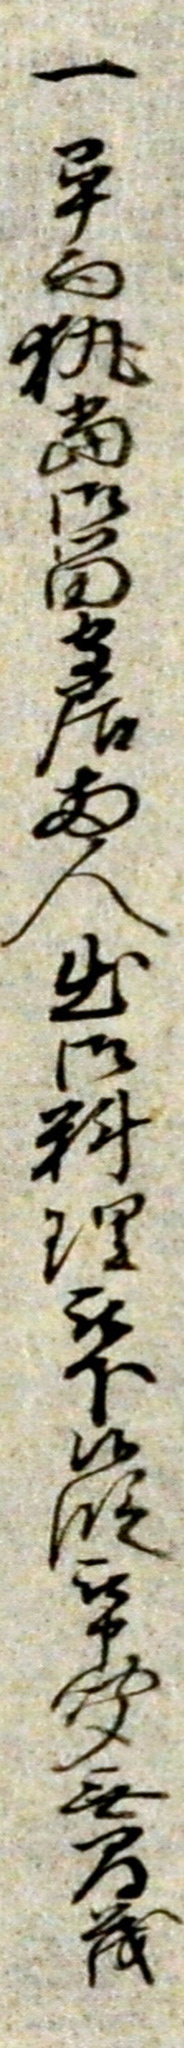一畢而執当御留守居両人出御料理被下候段被申聞無間
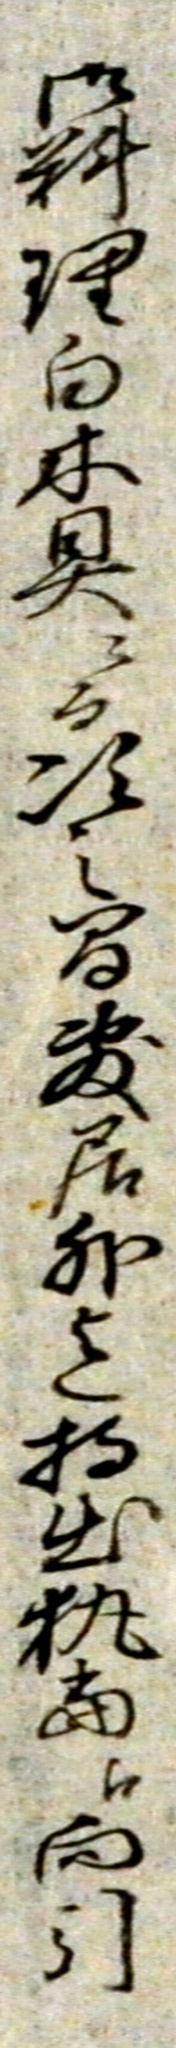茂御料理白木具ニ而次之間敷居外迄持出執当江向引
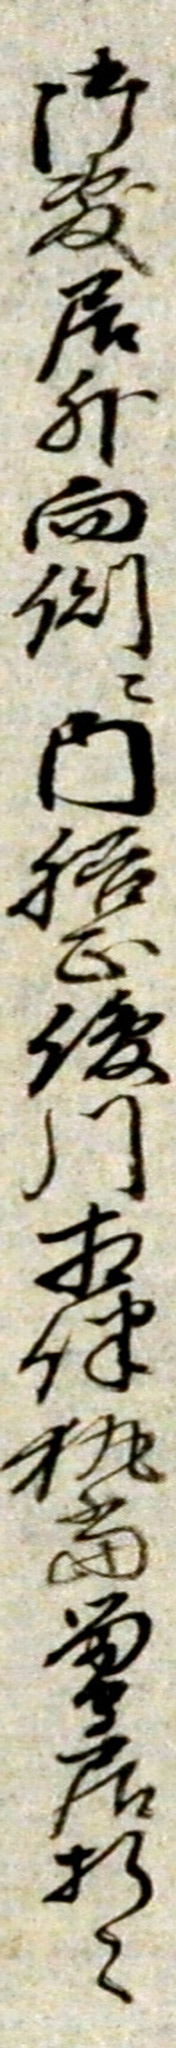御敷居外向側ニ内膳正俊川相伴執当守店折々
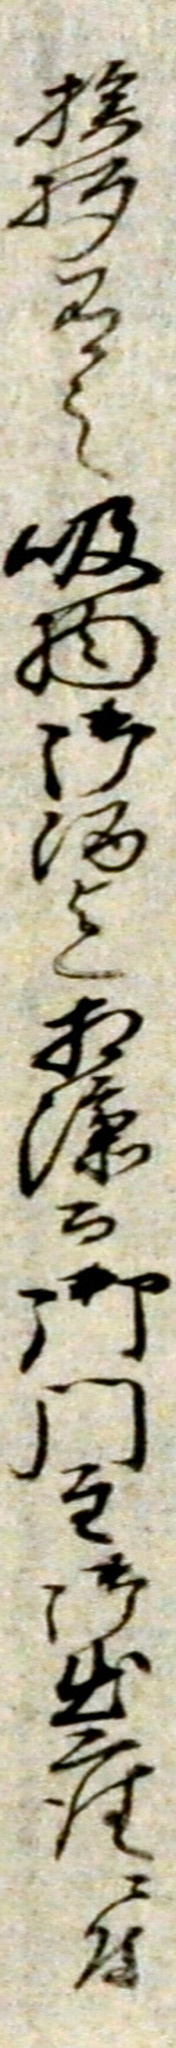挨拶有之吸物御酒迄相済而御門主御出座ニ付
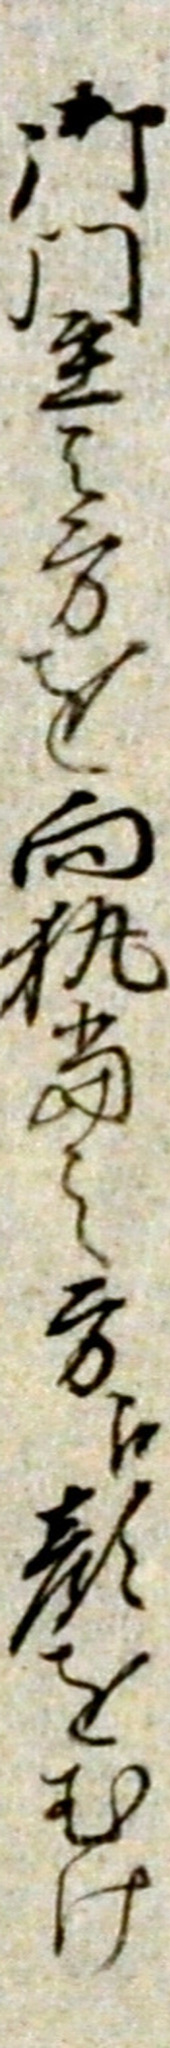御門主之方を向執当之方江顔をむけ
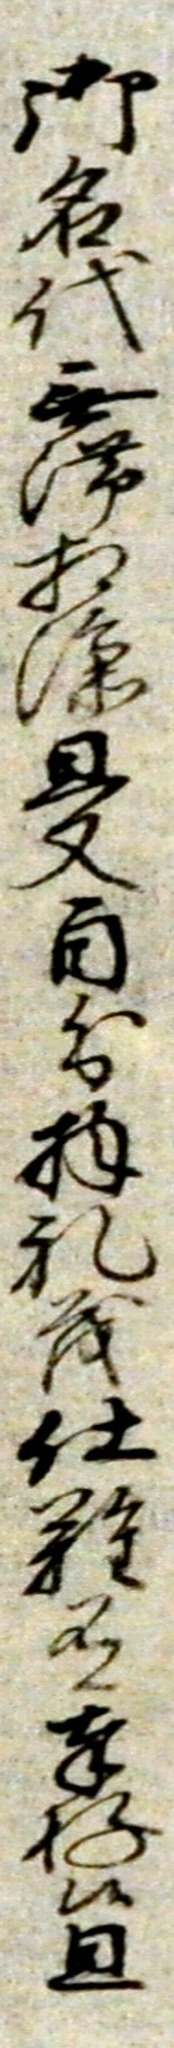御名代無滞相済且又自分拝礼も仕難有奉候且
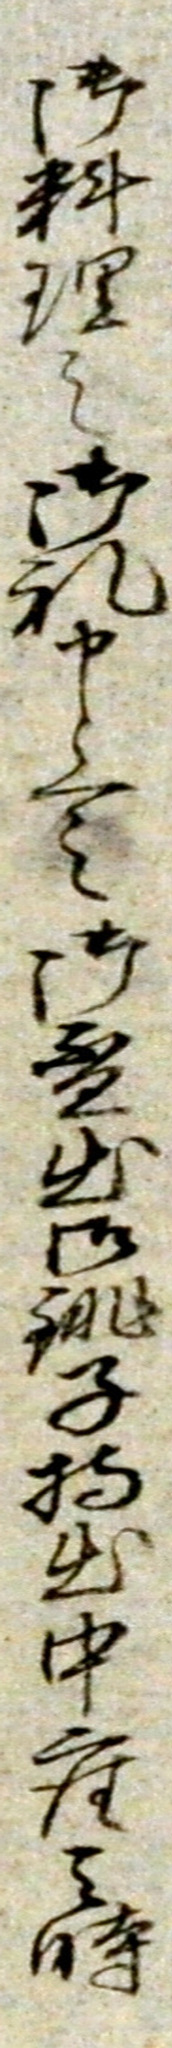御料理之御礼申上之御盃出御銚子持出中座之時
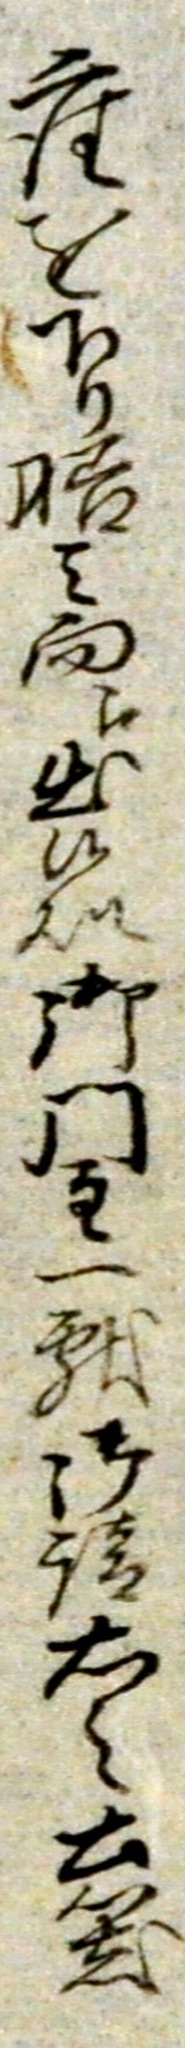座を下り膳之向江出候処御門主一献御請右之土器
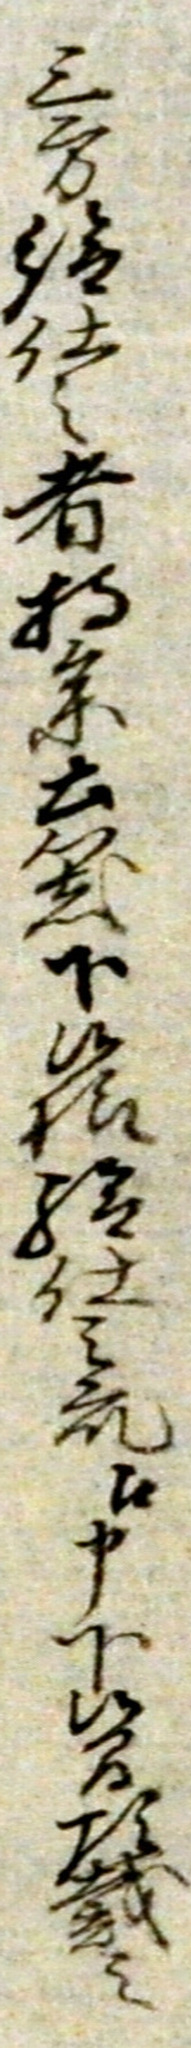三方給仕之者持参土器下候様給仕之衆江申下候間頂戴之
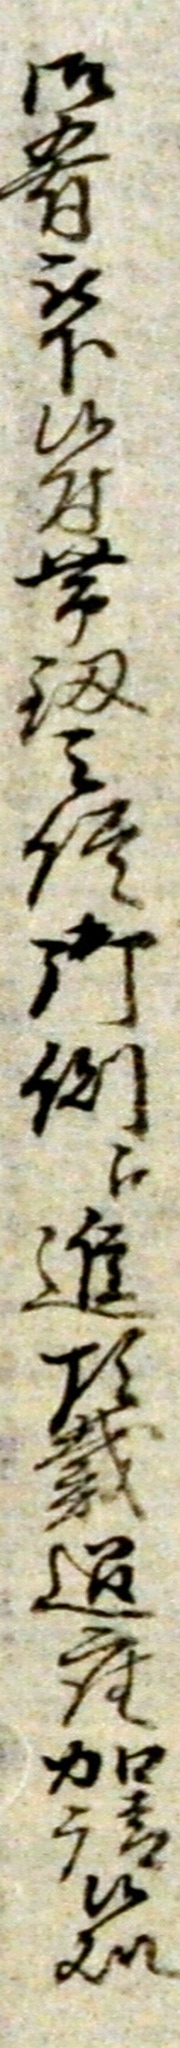御肴被下候付帯剣之儘御側江進頂戴退座加請候処
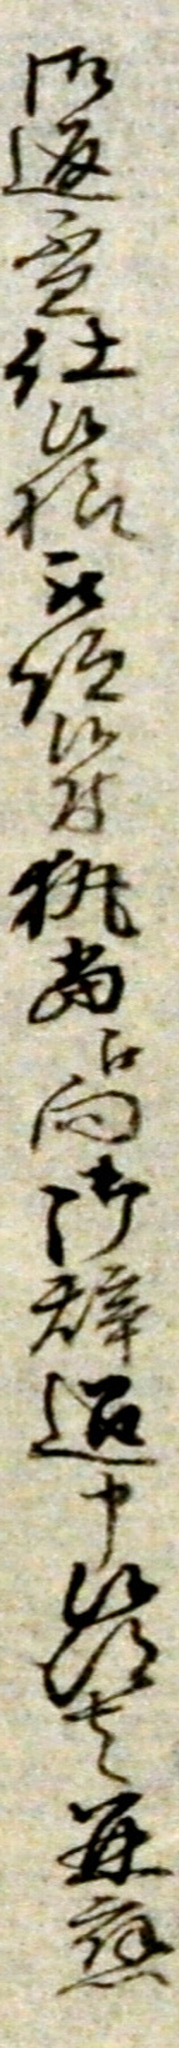御返不慮仕候様被仰候付執当江向御辞退申候得者再応
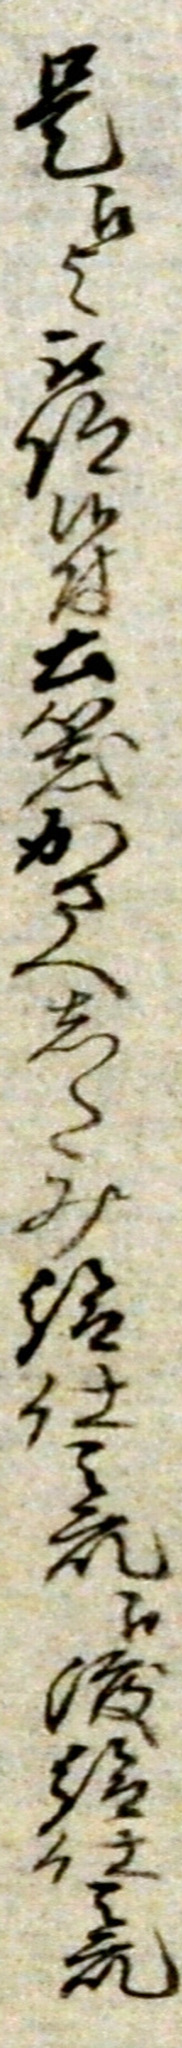是江と被仰候付土器かさへしたみ給仕之衆江渡給仕其衆
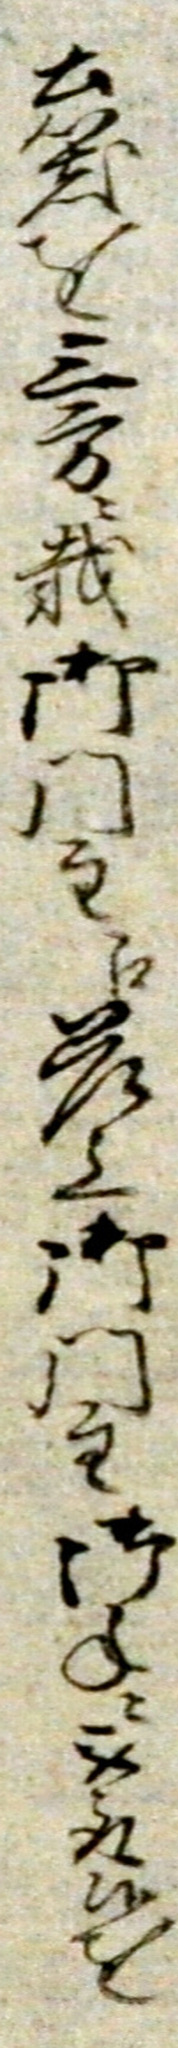土器を三方ニ載御門主江差上御門主御手ニ被取候を
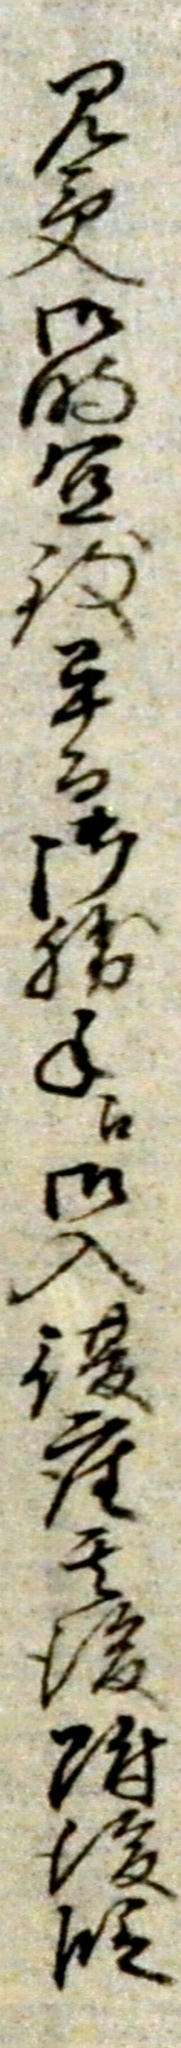見受御時宜致畢而御勝手江御入複座其後附後段

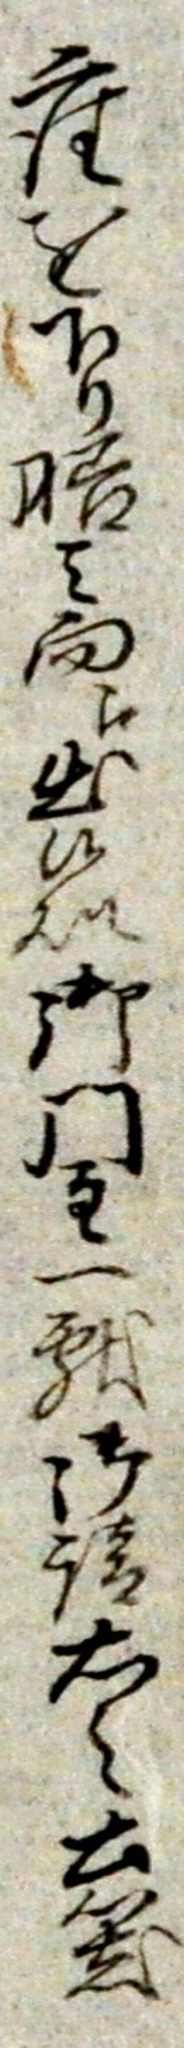座を下り膳之向江出候処御門主一献御請右之土器
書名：日光御名代相勤候節ノ留
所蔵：伊那市立高遠町図書館・合同会社AMANE
